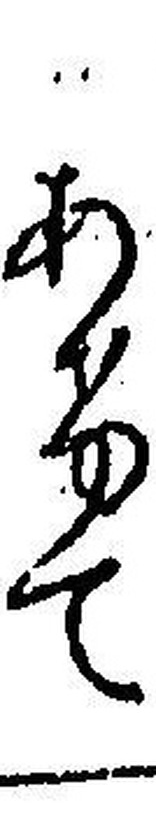あけて
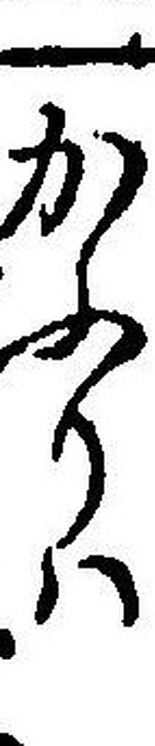かふりは
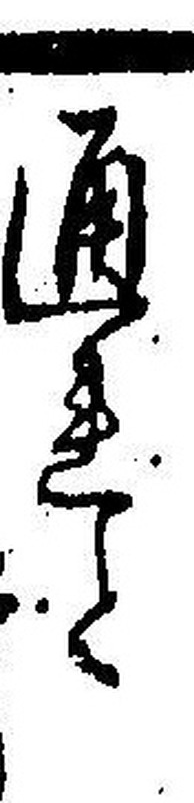通れと
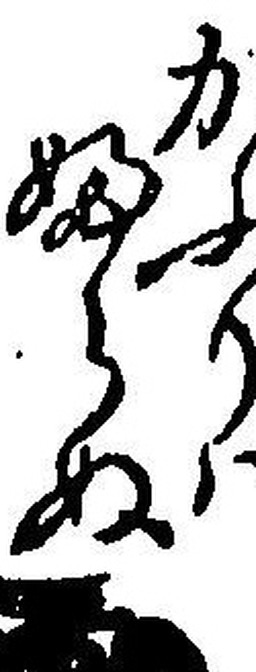ふらぬ
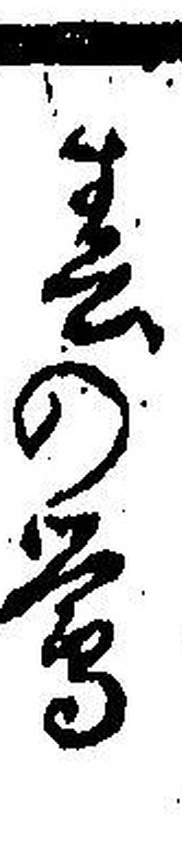春の鴬
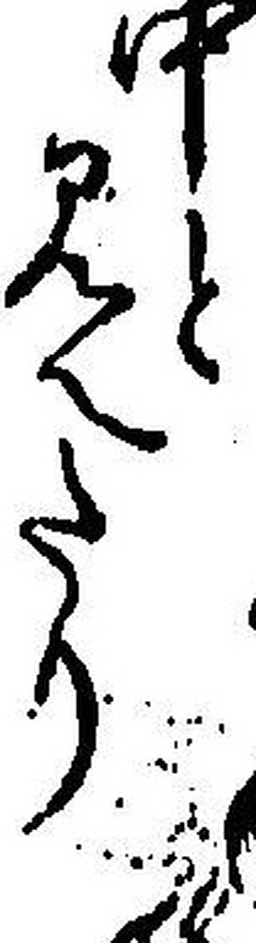見へたり
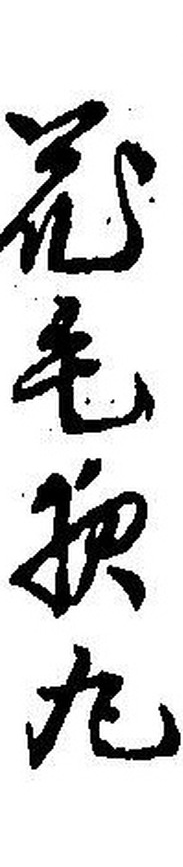花毛夜丸
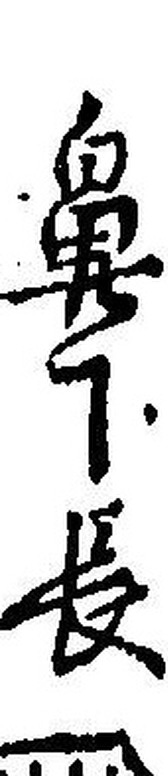鼻下長
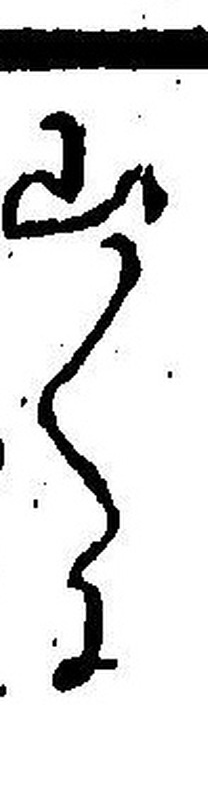山〳〵に
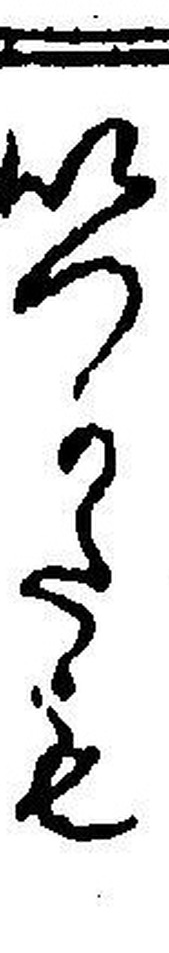いつかたも
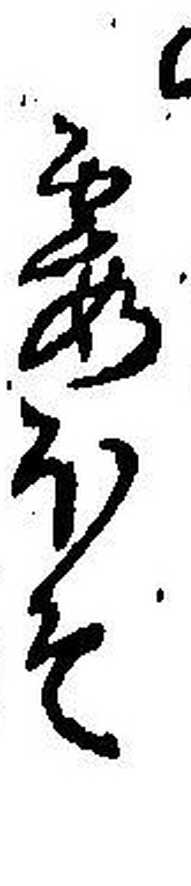霞ほそ
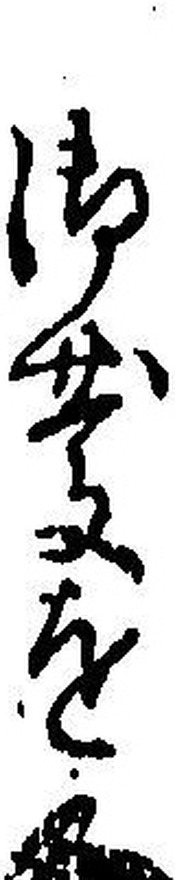御慶を
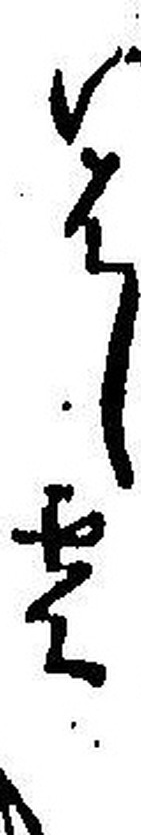いはし雲
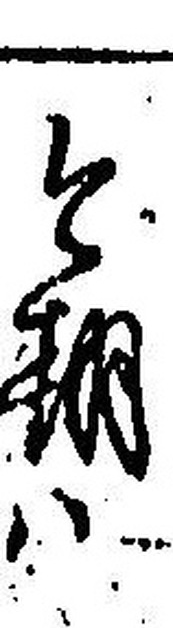今朝は
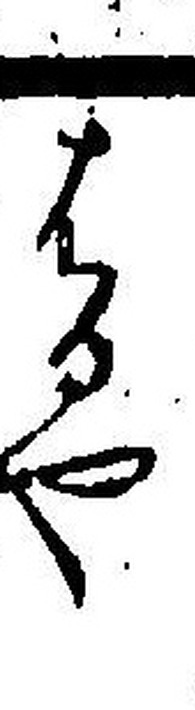はるや
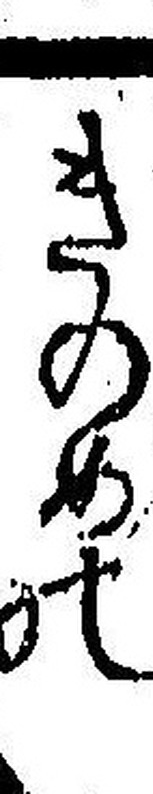きのめの
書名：どうれ百人一首 / 鹿都部真顔(狂歌堂)編
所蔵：東京大学総合図書館 General Library in the University of Tokyo, JAPAN
